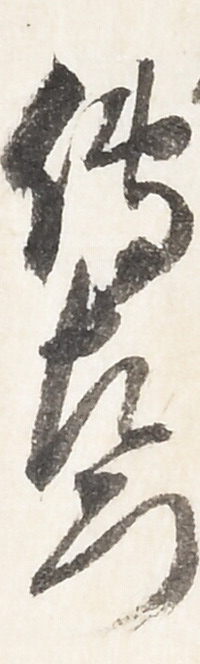伝左衛門
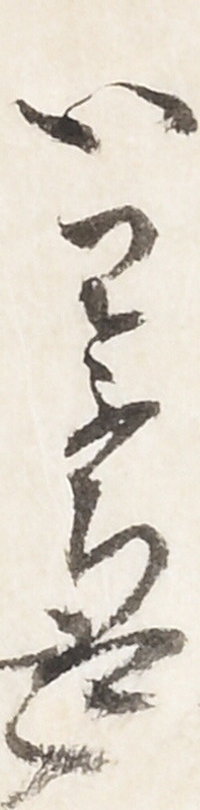いりふちや
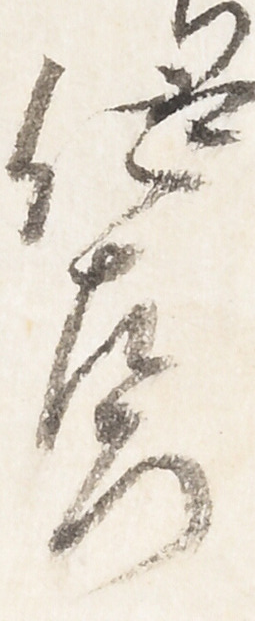伝左衛門
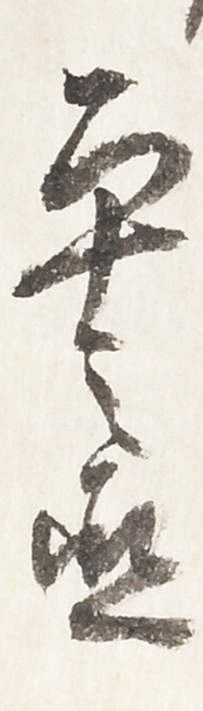平之丞
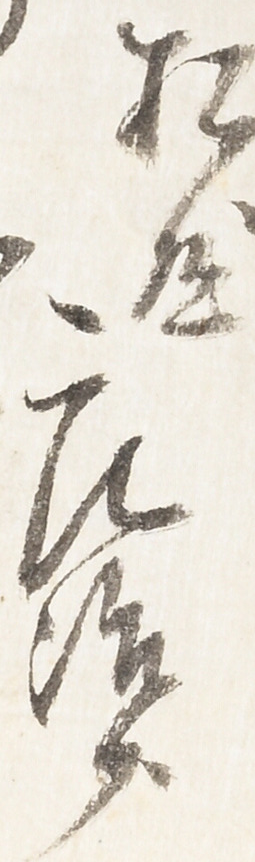三治郎
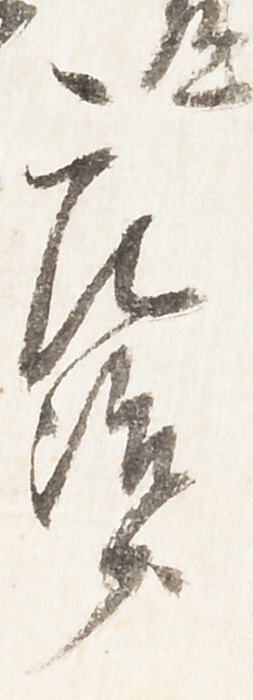庄治郎
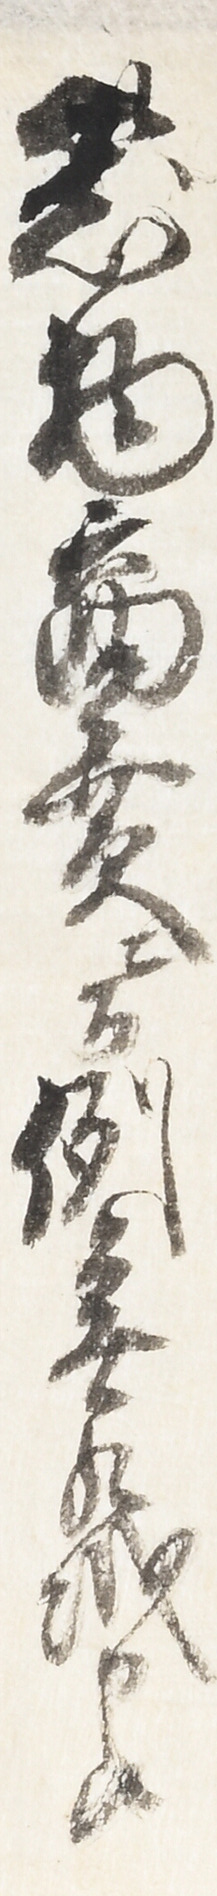器物商売ニ而例年罷越申候
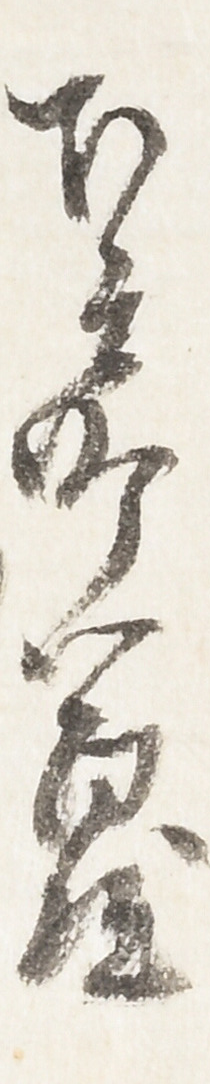下モ町冨屋
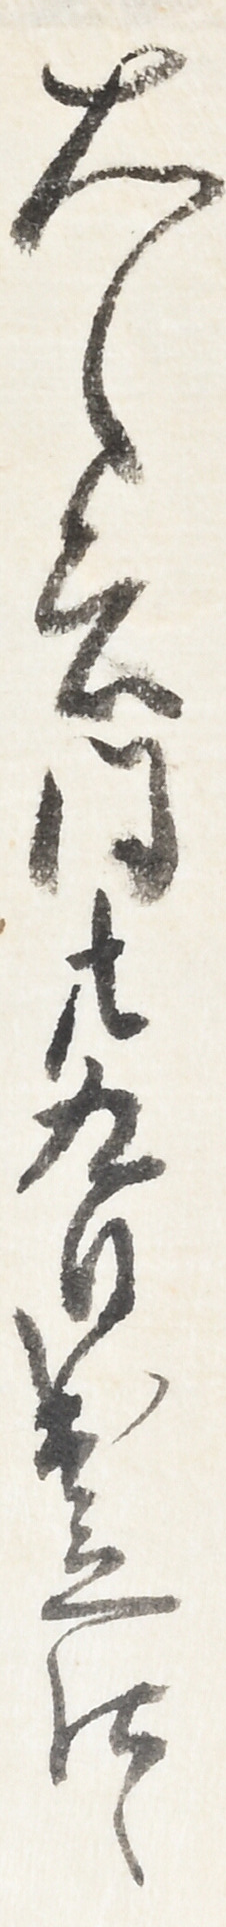右之者同廿九日出立仕候
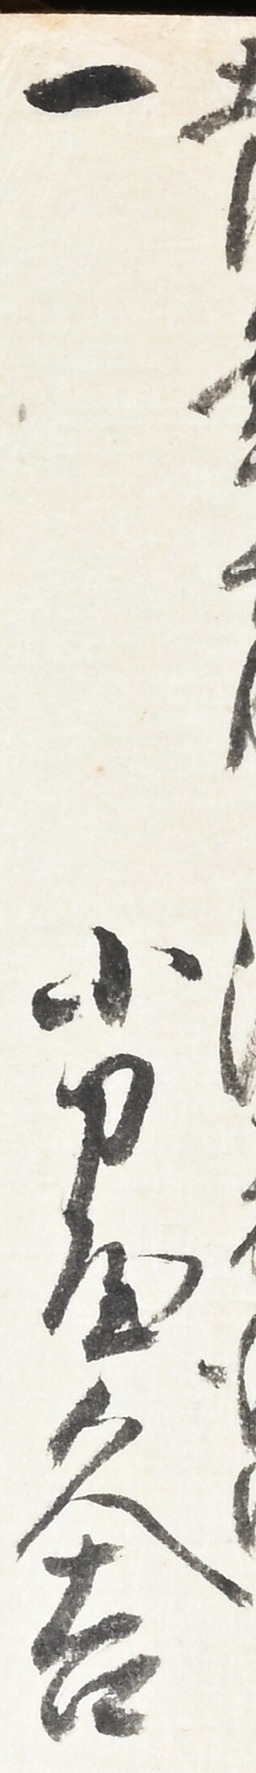一小刀屋久吉
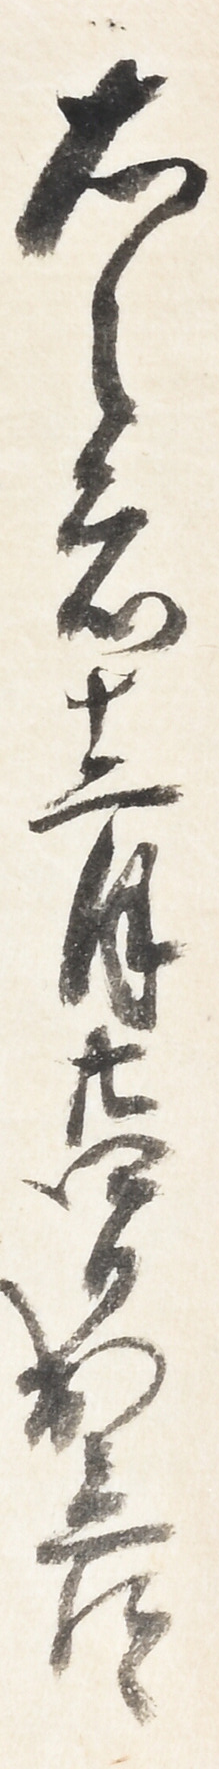右之者同廿九日出立仕候

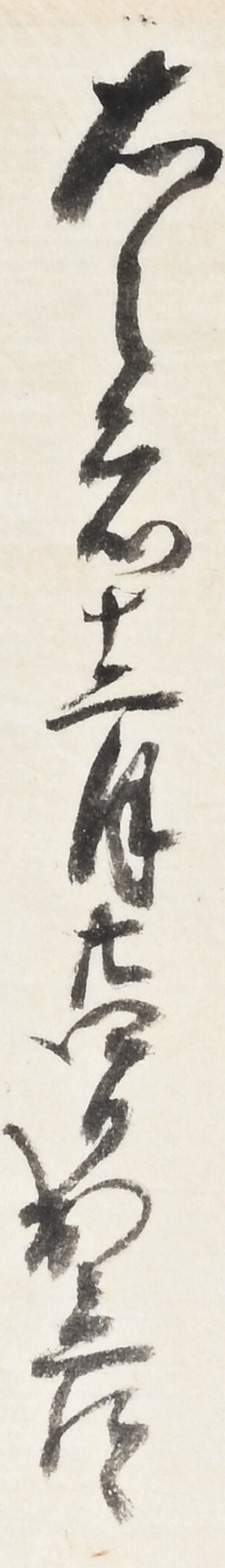右之者十二月廿四日出立仕候
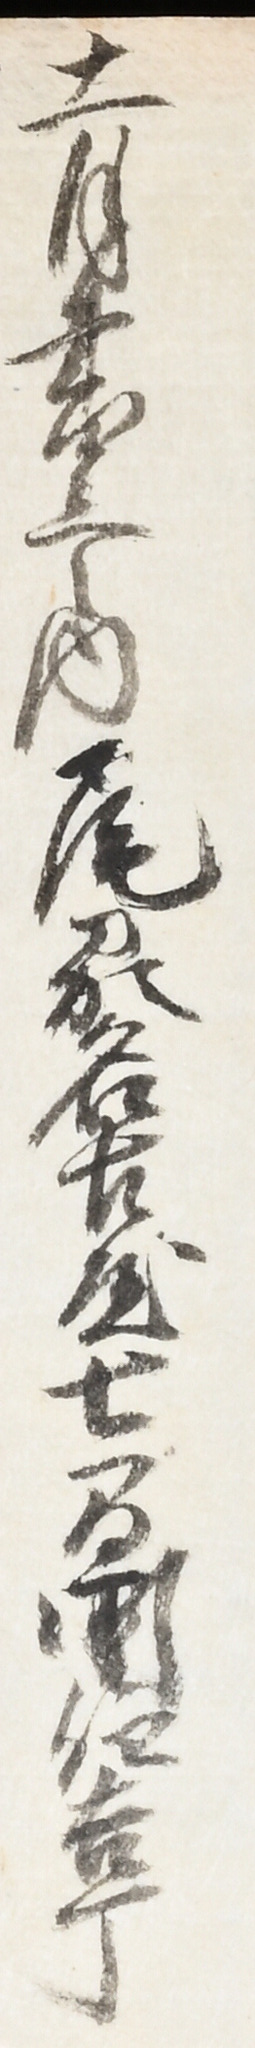十一月書上之内尾州名古屋七間町住吉丁
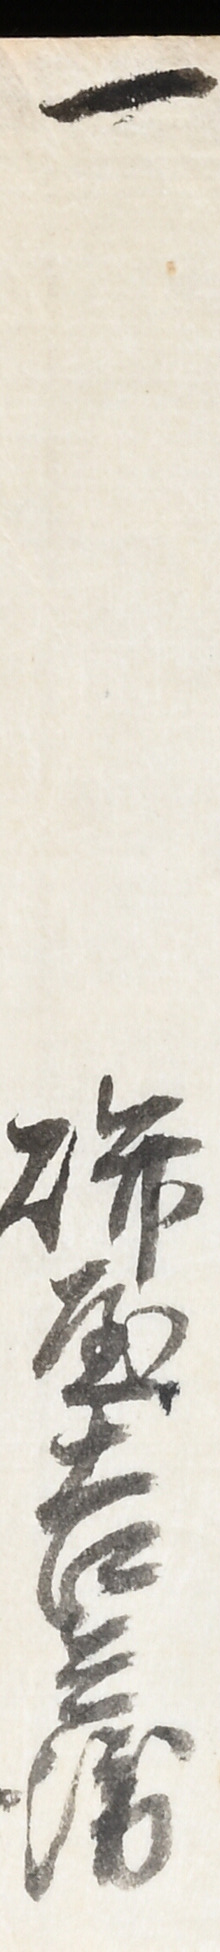一研屋吉兵衛
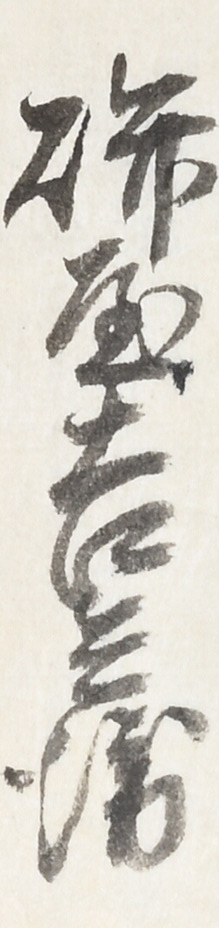一研屋吉兵衛
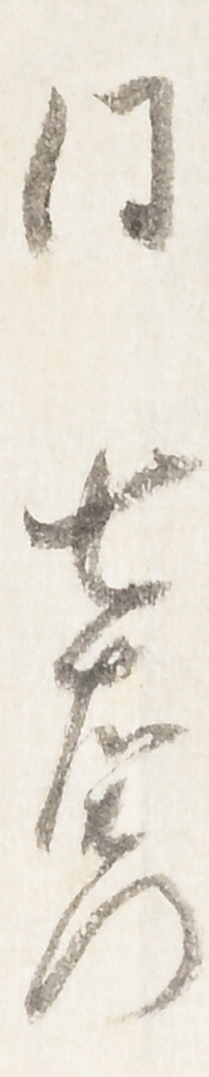同七右衛門
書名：旅人泊控帳
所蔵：伊那市立高遠町図書館・合同会社AMANE
